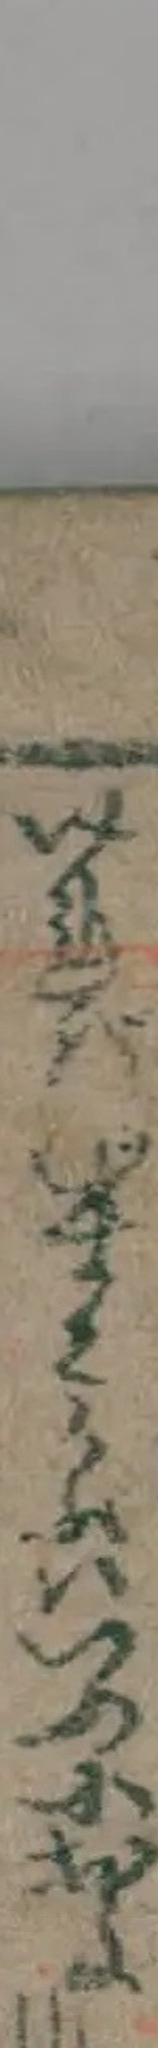ければすきうふはいふにおよ
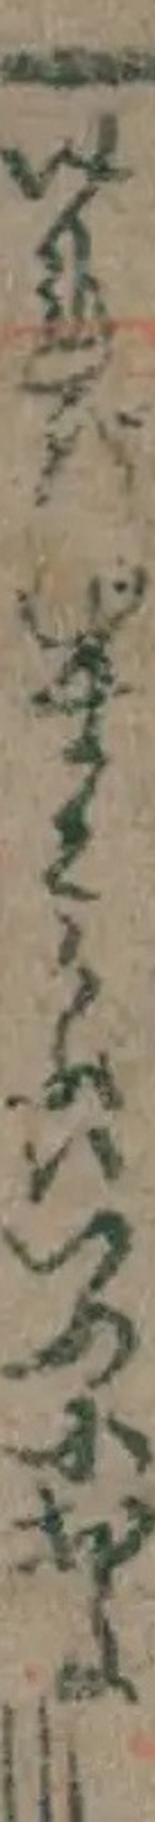ければすきうふはいふにおよ
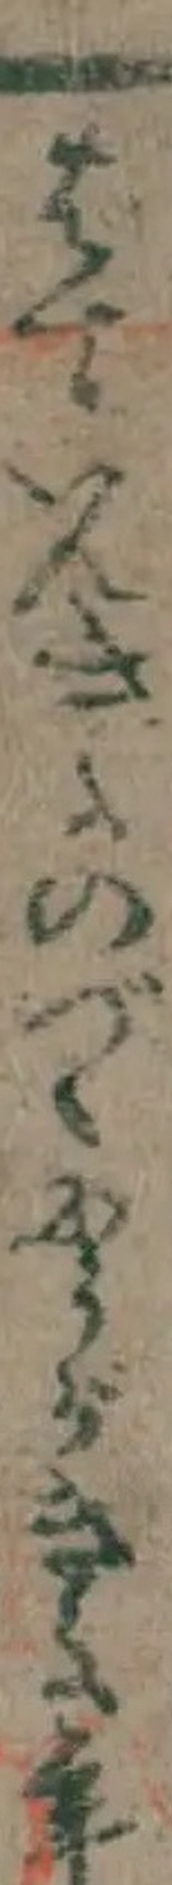はすいんきよのづゝにうがきよ年
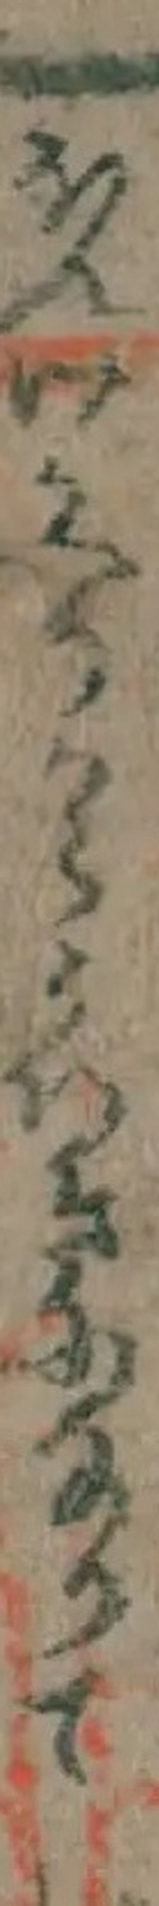ほんけがへりからうわきになりて
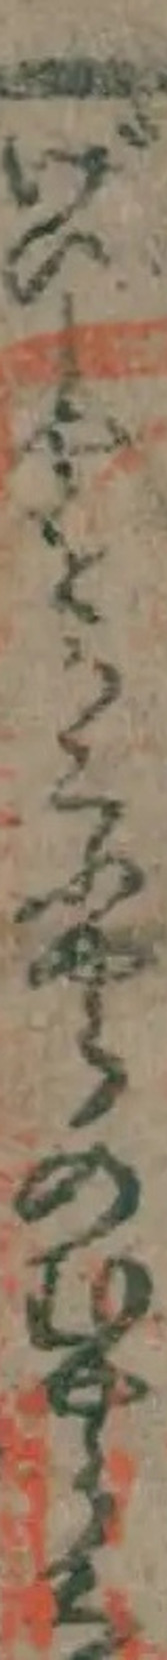げいしやをかこふやらのむやらくう
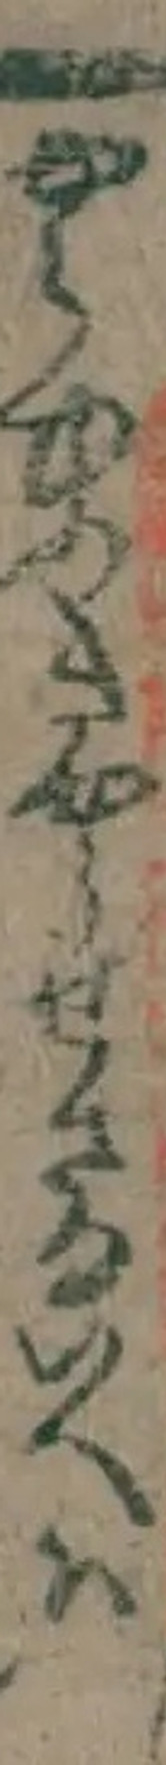やらゆふきやうせさるいへは
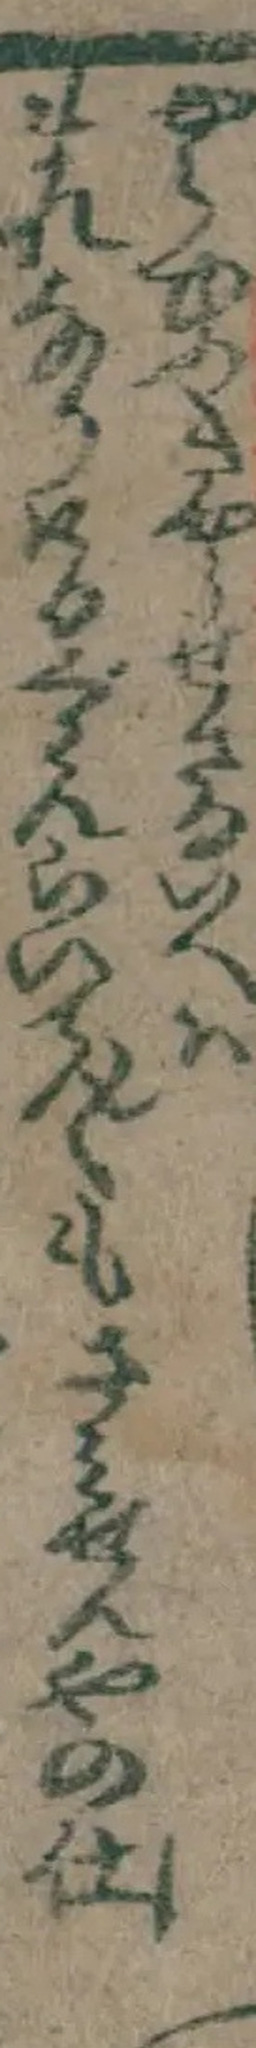まれなりけるぐわんらいてん〳〵もさみせんやの仕
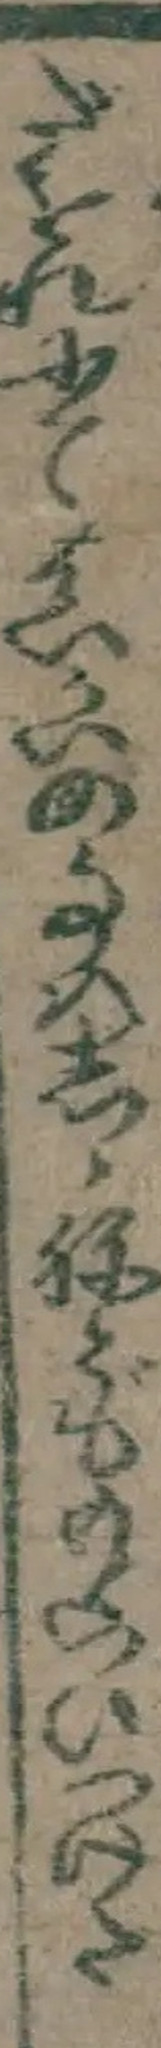だをれにてはいかいの事はしらねどももたつひつけた
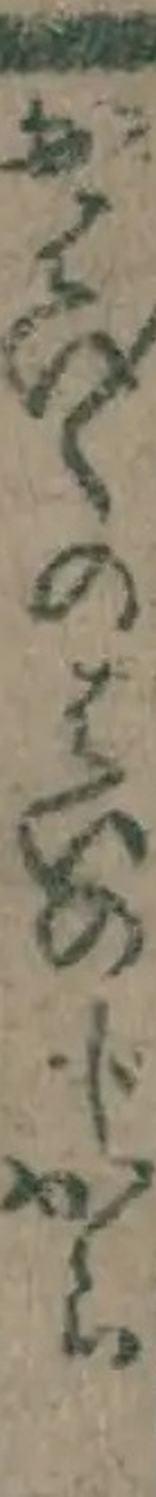おはい〳〵のはいのじから
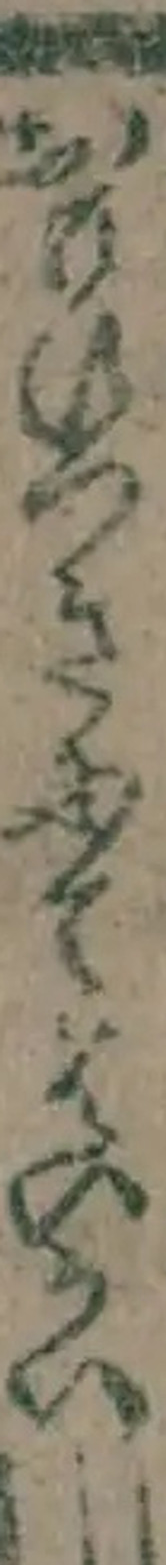おもひつきにてはいかい
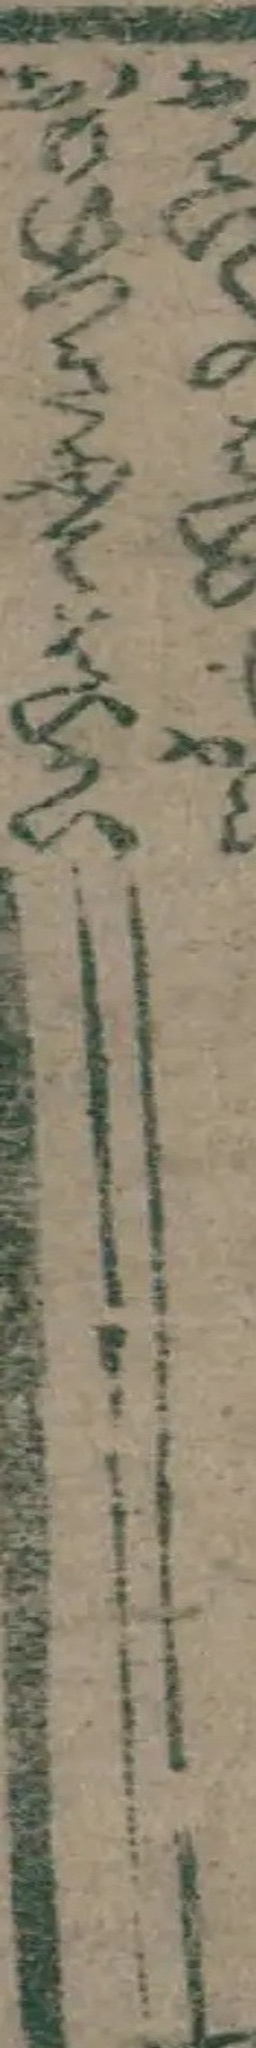おもひつきにてはいかい
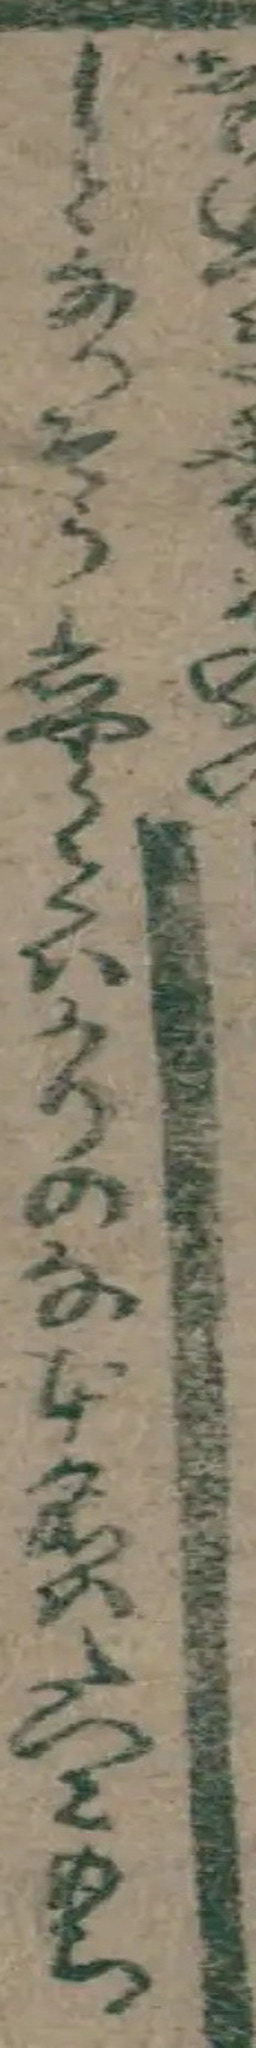しとなりそうしやうとはかりのな本名はたいこもち
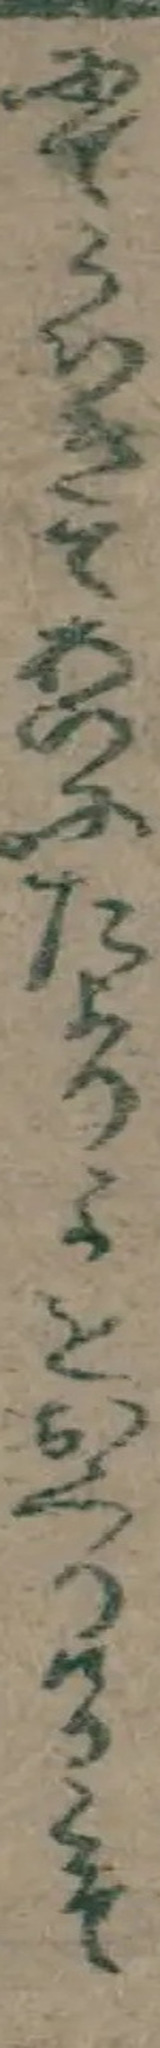にてうちきてあいにたよりよをおくりけるこそ
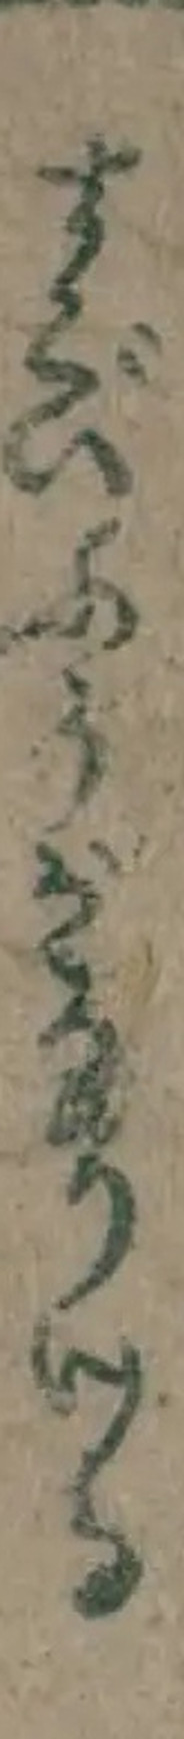すいふうがなりける
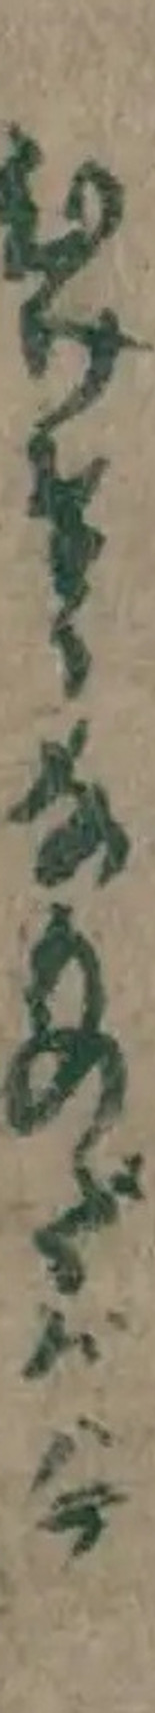ひけそうなものだがハテ

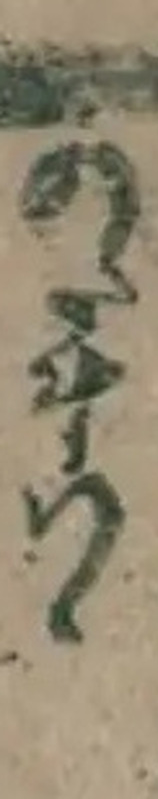のたまはく
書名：頓作時雨月 3巻
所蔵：国立国会図書館 National Diet Library, JAPAN
